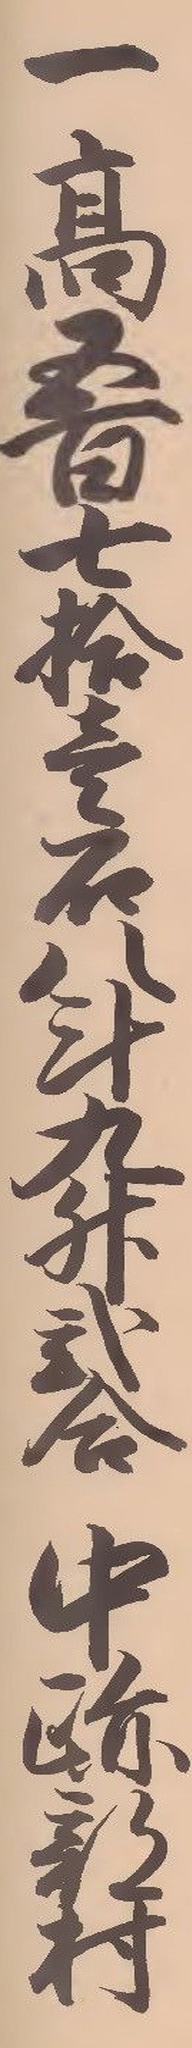一高五百七拾壱石八斗九升弐合中跡部村
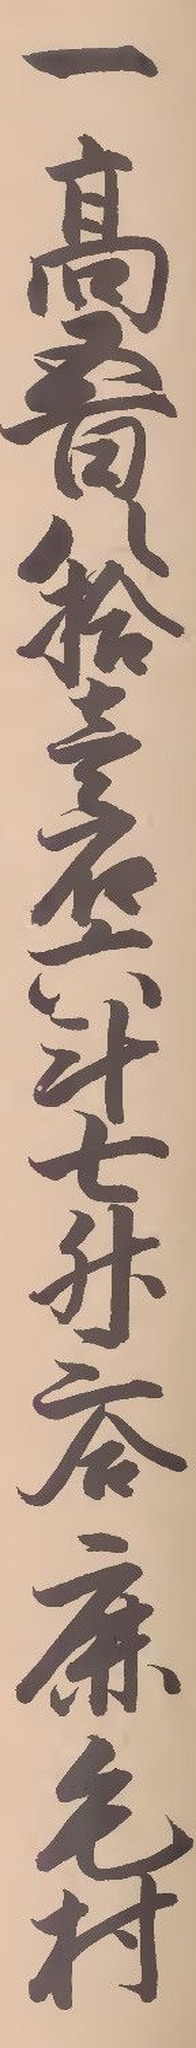一高五百八拾壱石六斗七升三合鹿毛村
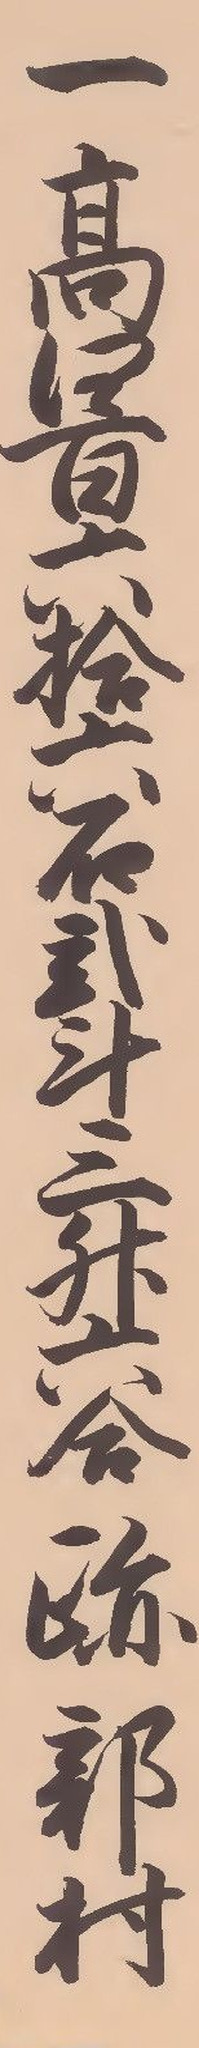一高四百六拾六石弐斗三升六合跡部村
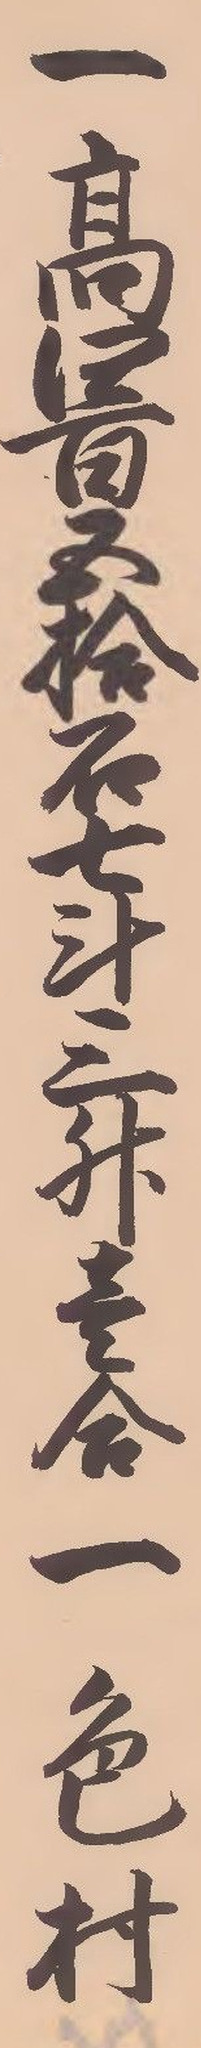一高四百五拾石七斗三升壱合一色村
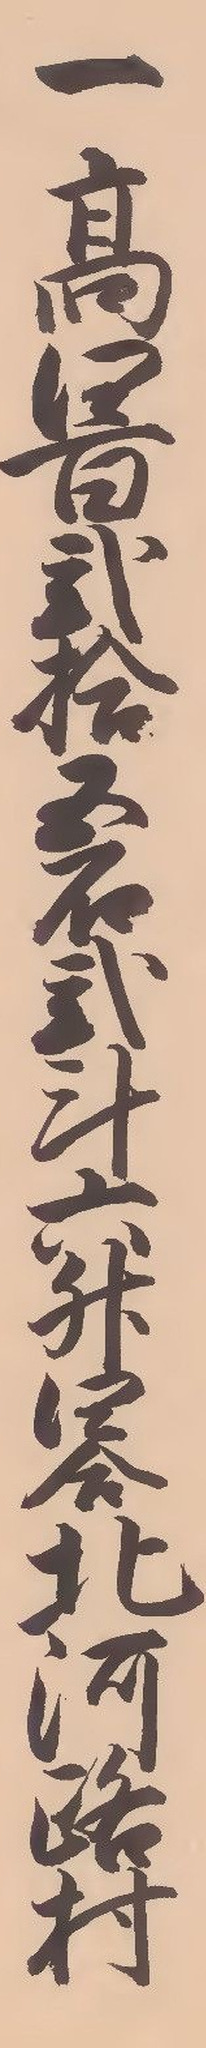一高四百弐拾五石弐斗六升四合北河路村

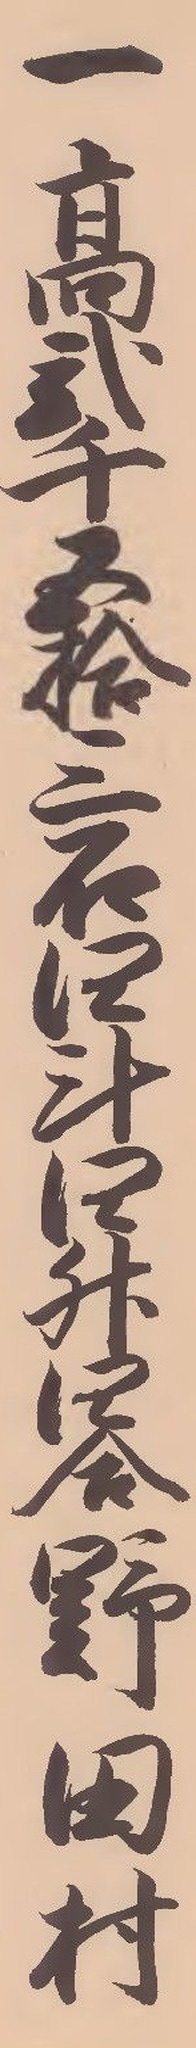一高弐千五拾三石四斗四升四合野田村
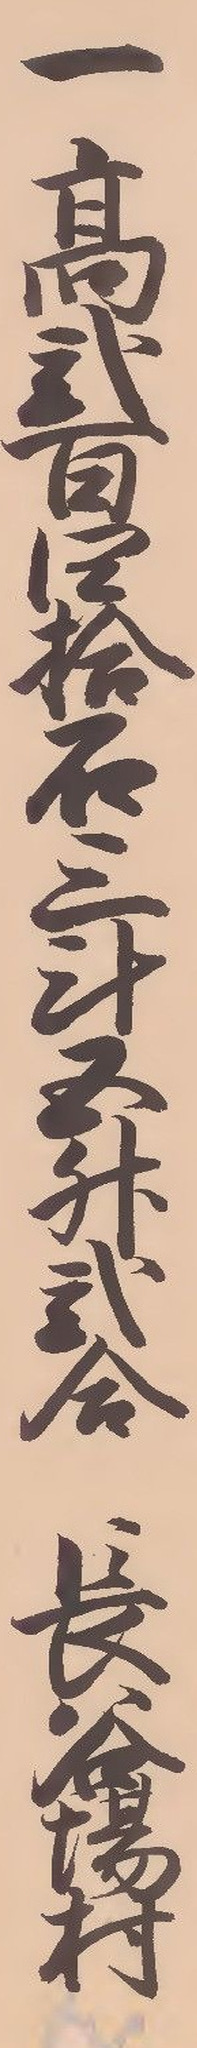一高弐百四拾石三斗五升弐合長谷場村
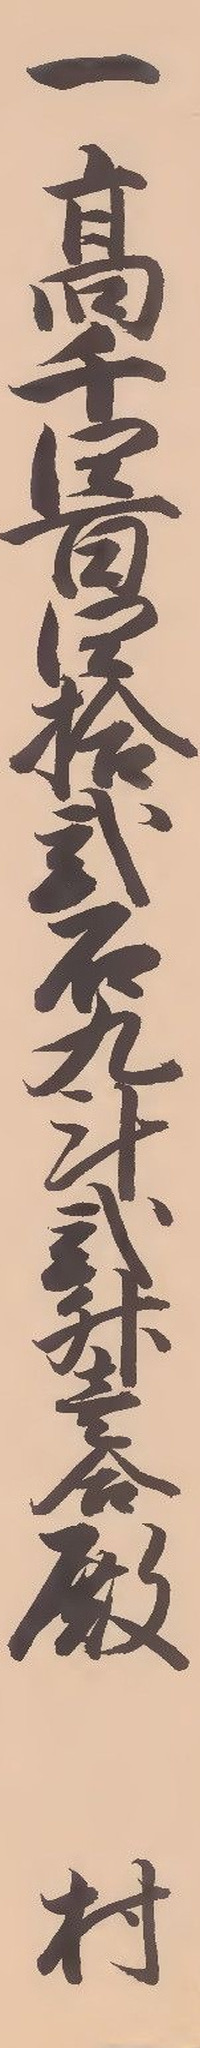一高千四百四拾弐石九斗弐升壱合殿村
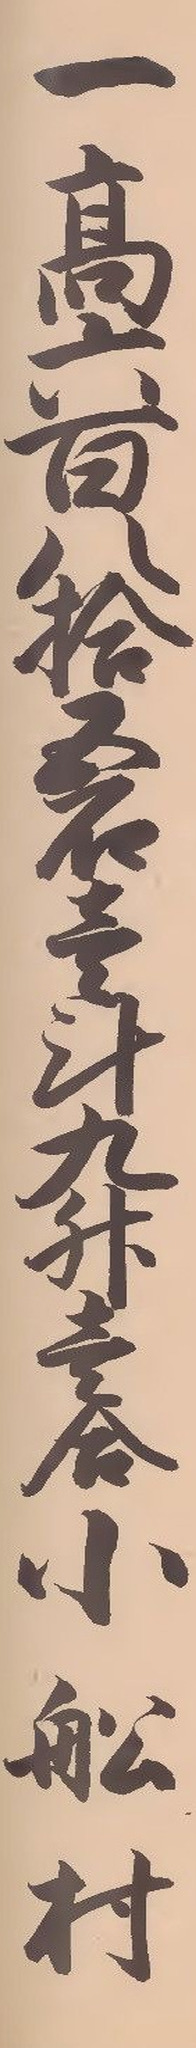一高六百八拾五石壱斗九升壱合小船村
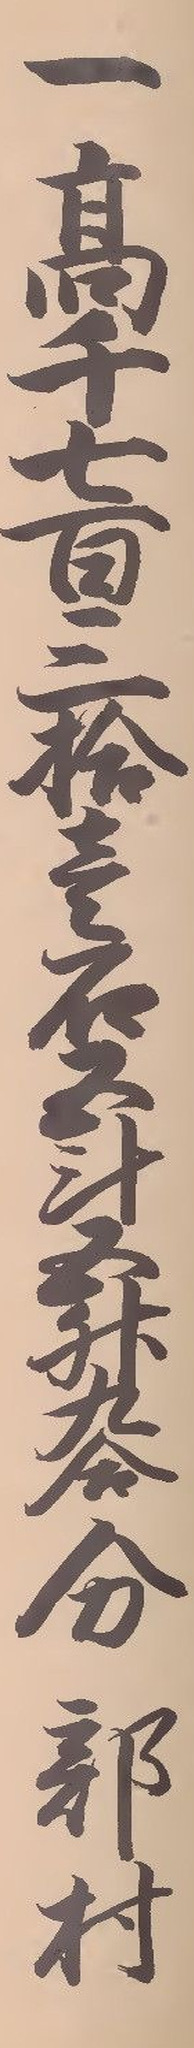一高千七百三拾壱石五斗五升九合分部村
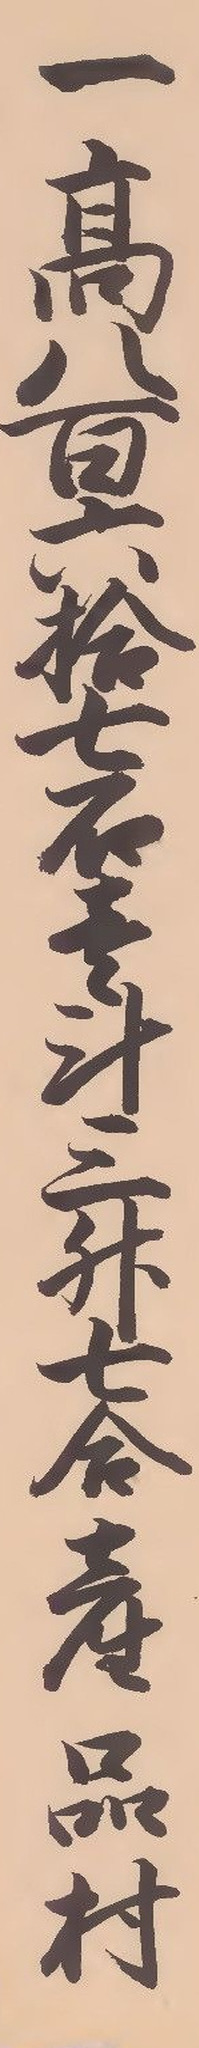一高八百六拾七石壱斗三升七合産品村
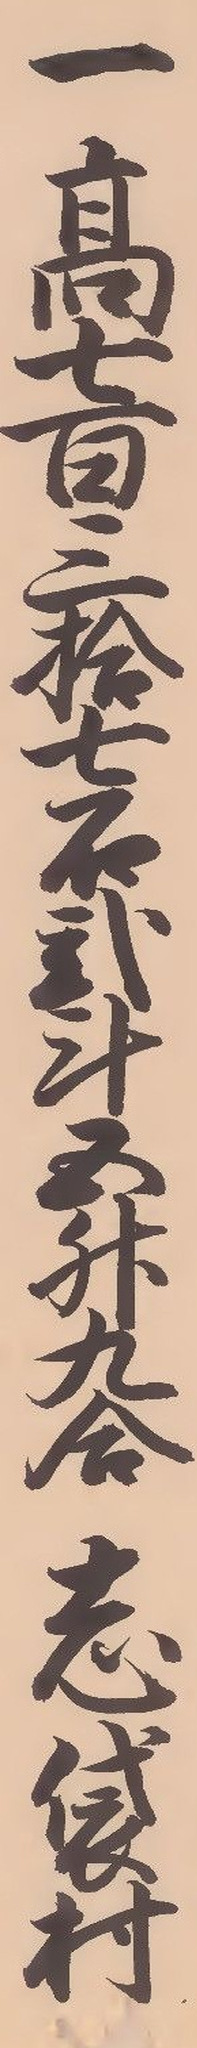一高七百三拾七石弐斗五升九合志袋村
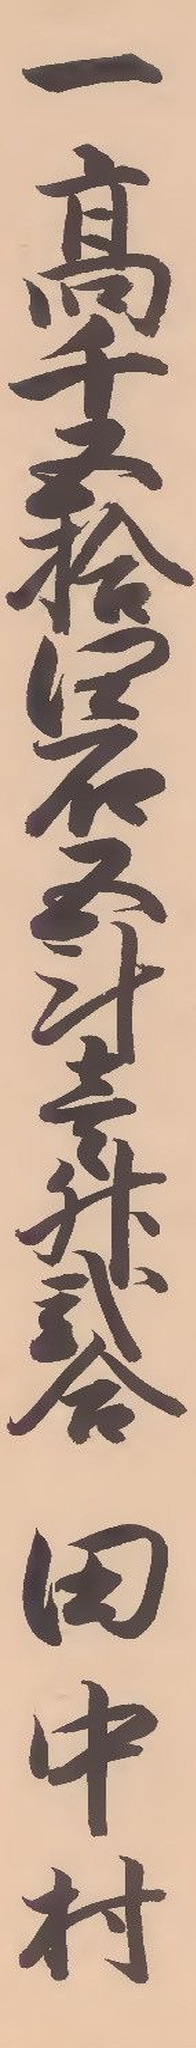一高千五拾四石五斗壱升弐合田中村

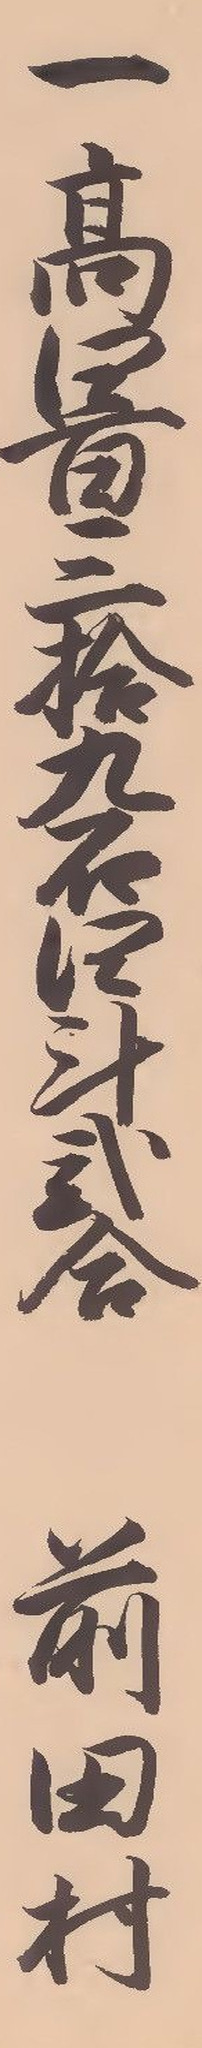一高四百三拾九石四斗弐合前田村
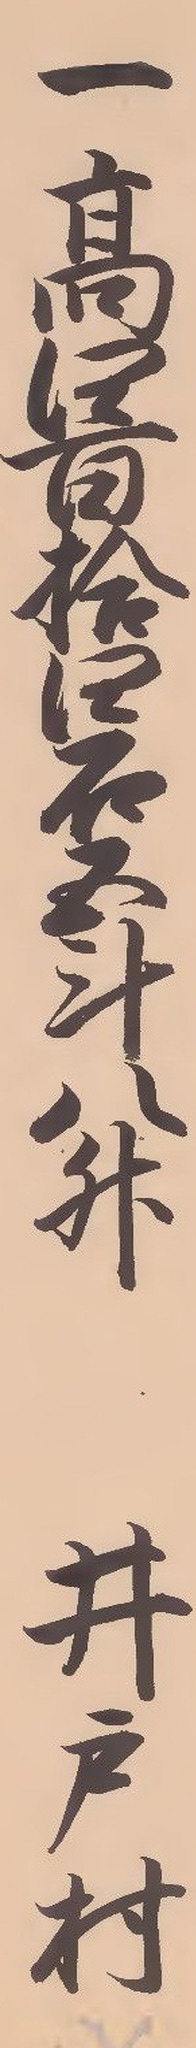一高四百拾四石五斗八升井戸村
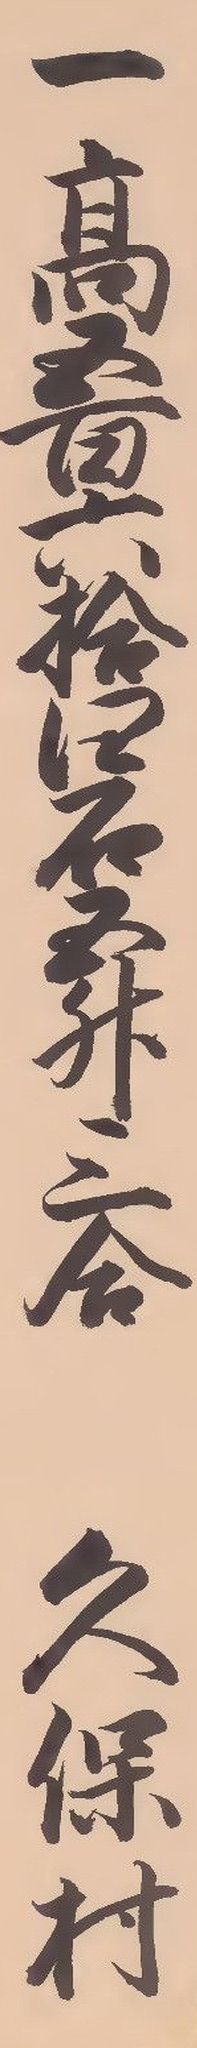一高五百六拾四石五升三合久保村
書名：伊勢国郷帳
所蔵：国立公文書館 National Archives of Japan
